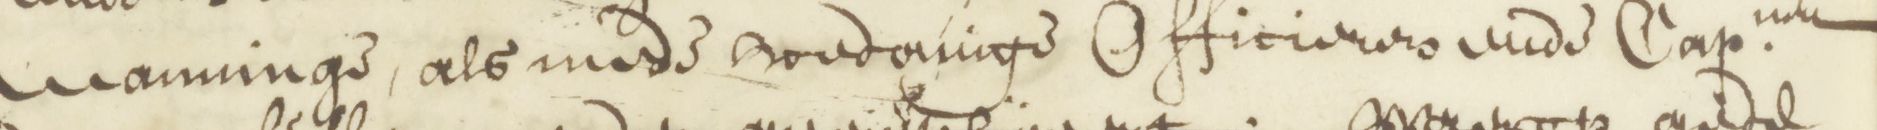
manninge, als mede hoedanige officieren ende Cap.nen
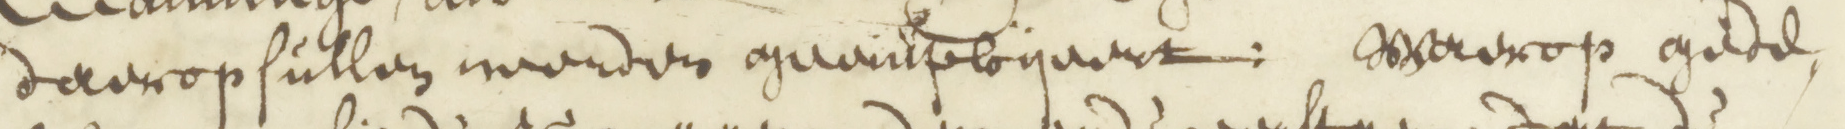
daerop sullen worden geemploijeert. Waerop gede„
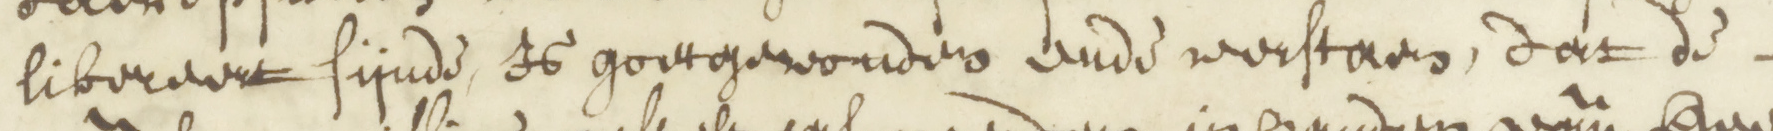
libereert sijnde, Is goetgevonden ende verstaen dat de
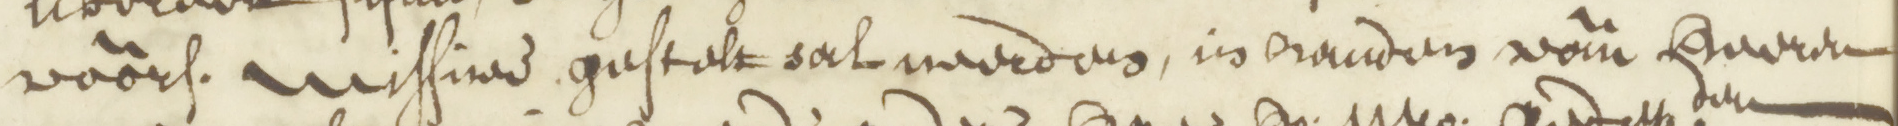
voors. missive gestelt sal werden in handen van Heeren
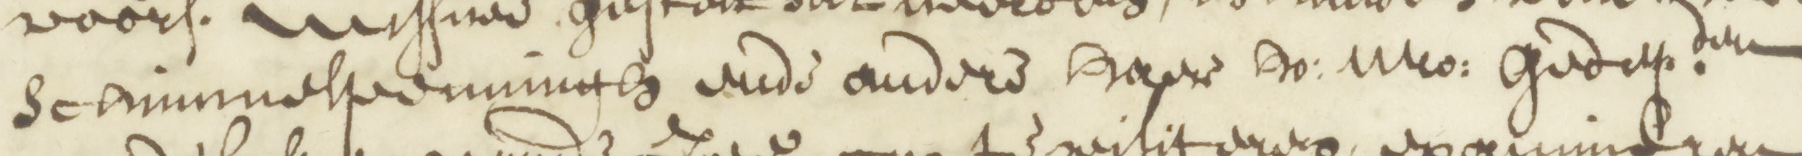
Schimmelpenningh ende andere haer Ho:Mo: Gedep.den
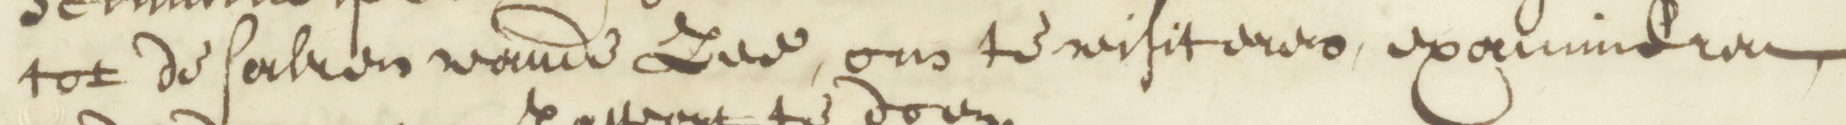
tot de saken van de Zee, om te visiteren, examineren
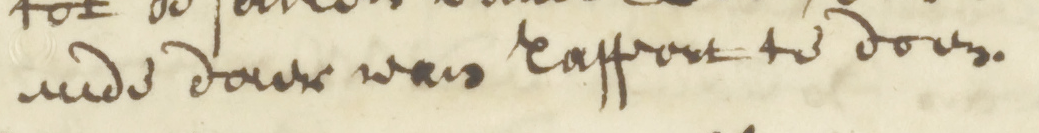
ende daer van rapport te doen.
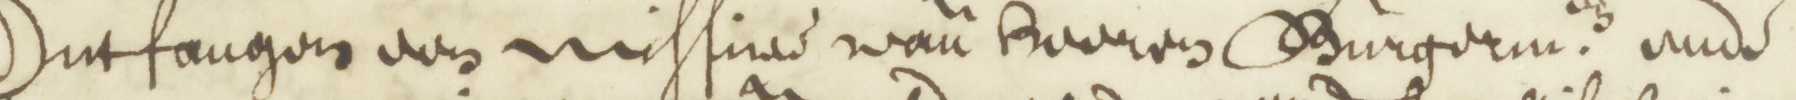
Ontfangen een missive van heeren Burgerm.en ende
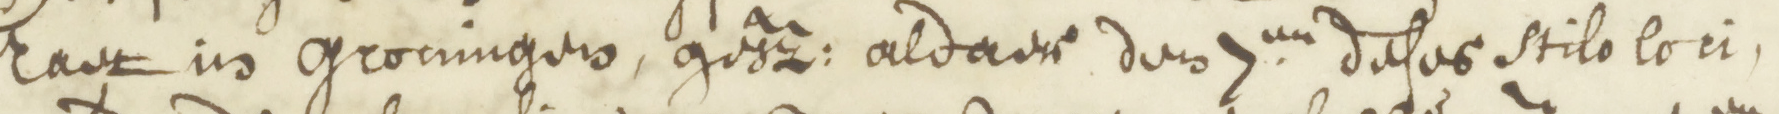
raet in Groningen gesr. aldaer den 7en deses stilo loci
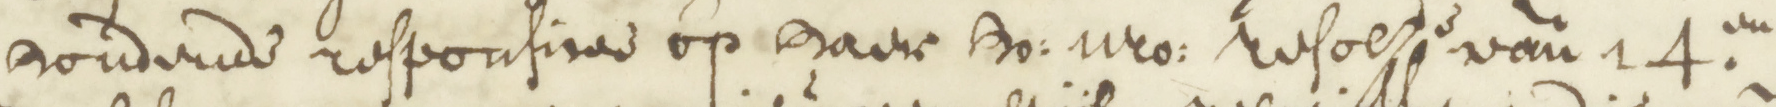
houdende responsive op haer Ho: Mo: resol.e van 14.en
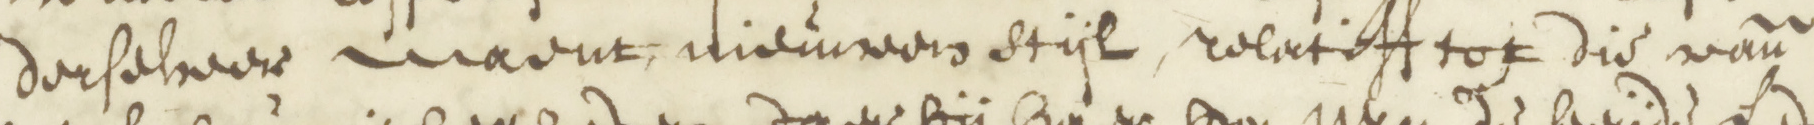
derselver maent, nieuwen stijl, relatiff tot die van
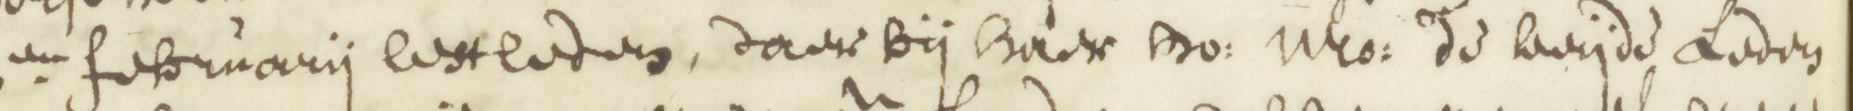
7en februarij lestleden, daer bij haer Ho:Mo: de beijde Leden
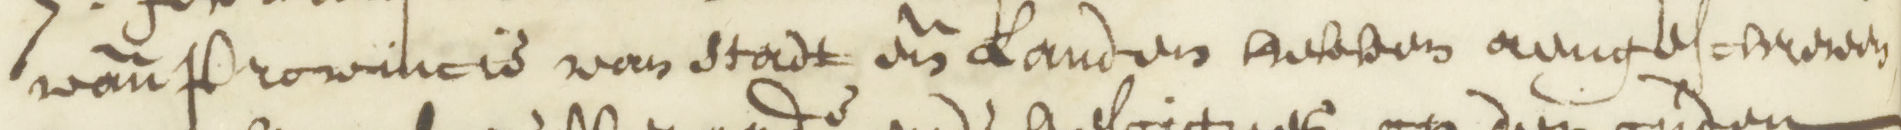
van Provincie van Stadt en Landen hebben aengeschreven
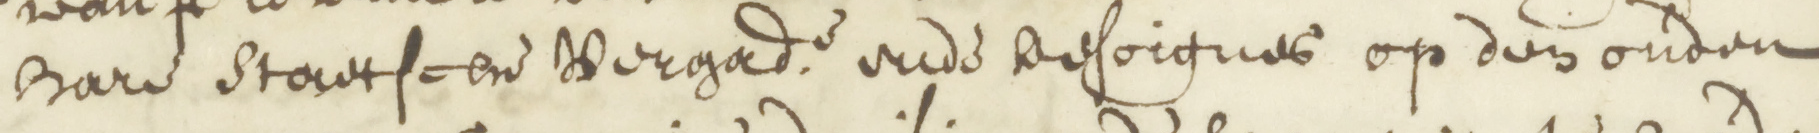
hare Staetsche Vergad.e ende besoignes op den ouden
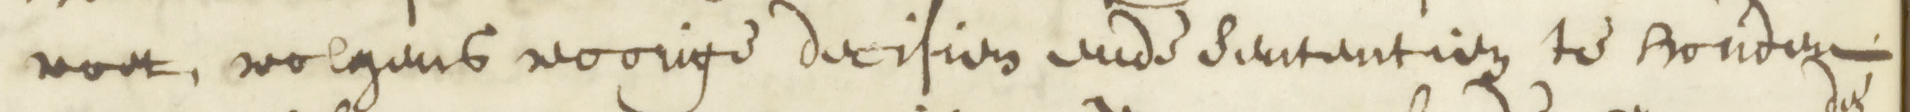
voet, volgens voorige decisien ende sententien te houden.
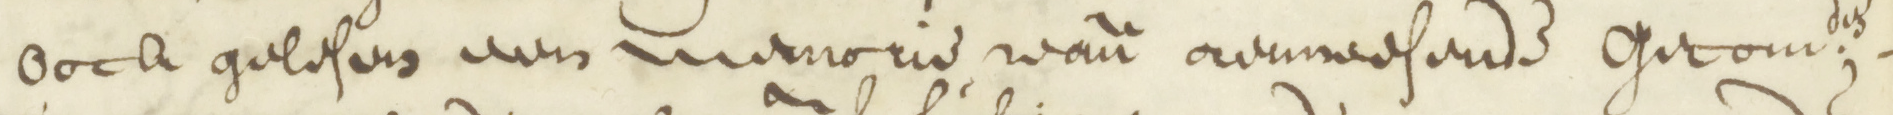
Oock gelesen een memorie van aenwesende Gecom.den
